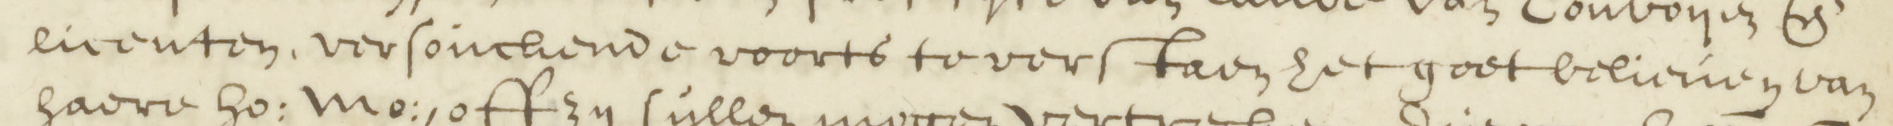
licenten, versouckende voorts te verstaen het goet belieuen van
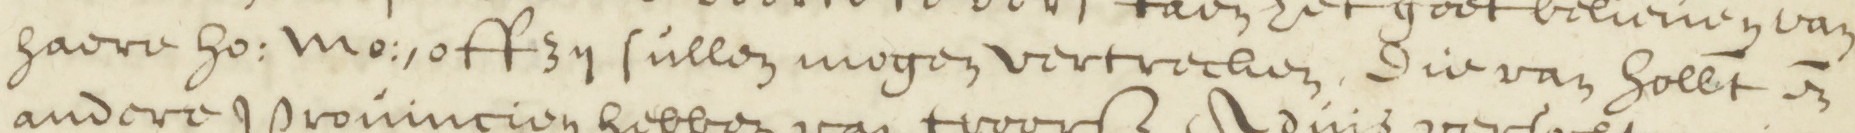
haere Ho:Mo:, off zy sullen mogen vertrecken die van Hollt en
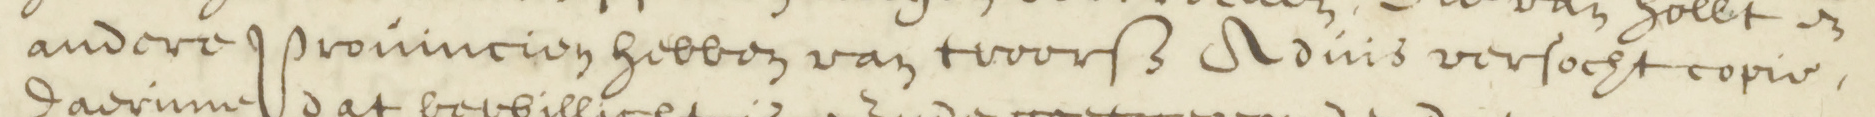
andere Provincien hebben van tvoors Aduis versocht copie,
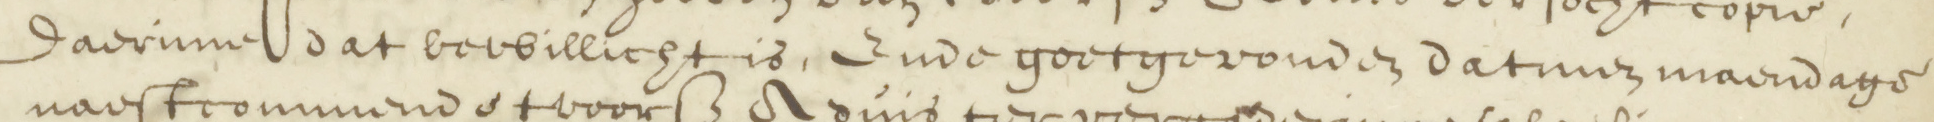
daerinne dat bewillicht is. Ende goetgevonden datmen maendags
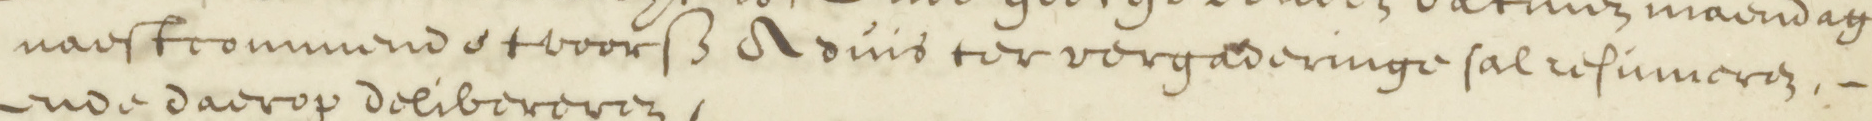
naestcommende tvoors Aduis ter vergaderinge sal resumeren
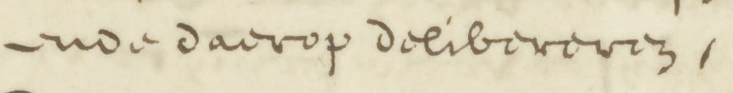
ende daerop delibereren.
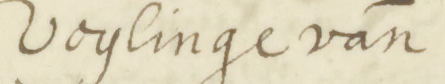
Veylinge van
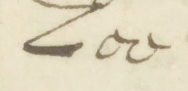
Zee
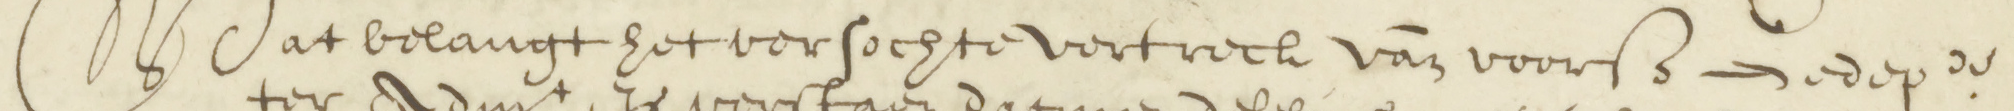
Wat belangt het versochte vertreck van voors Gedepde
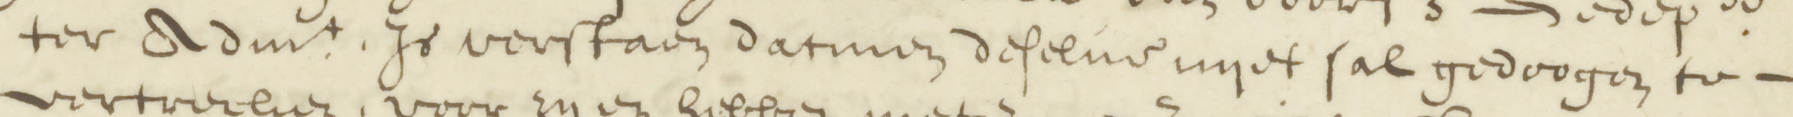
ter Admt, Is verstaen datmen deselue nyet sal gedoogen te -
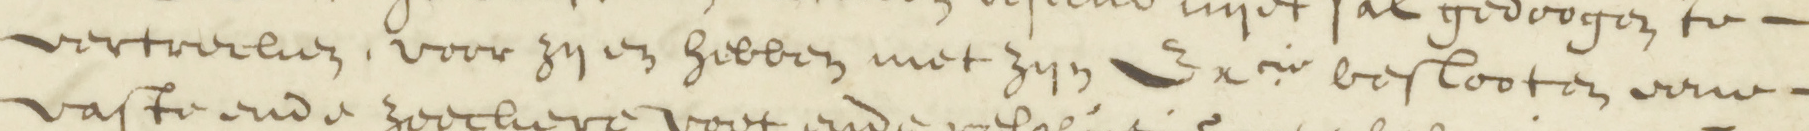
vertrecken voor zy en hebben met zyn Excie beslooten eene
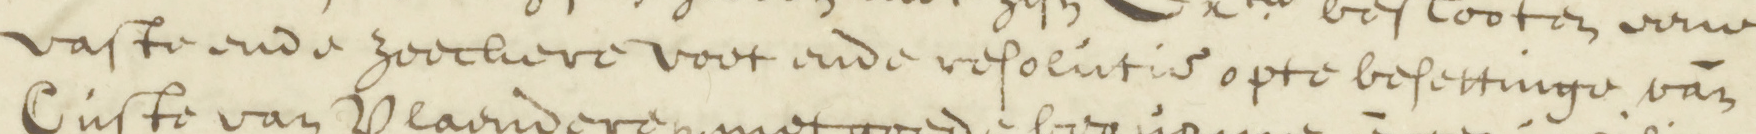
vaste ende zeeckere voet ende resoltie opte besettinge van
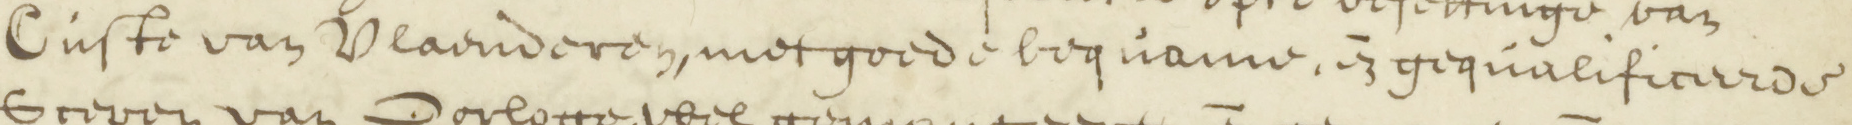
Custe van Vlaenderen, met goede bequame en gequalificeerde
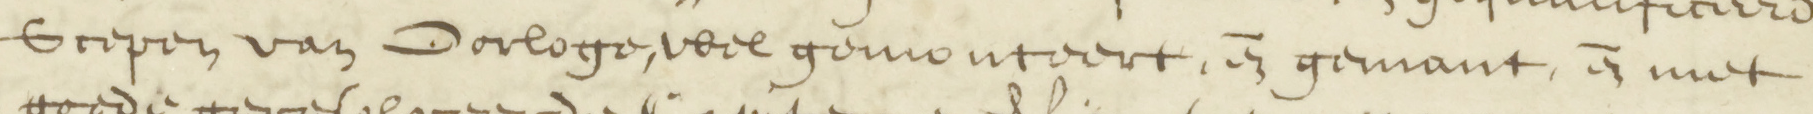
scepen van Oorloge, wel gemonteert, en gemant, en met
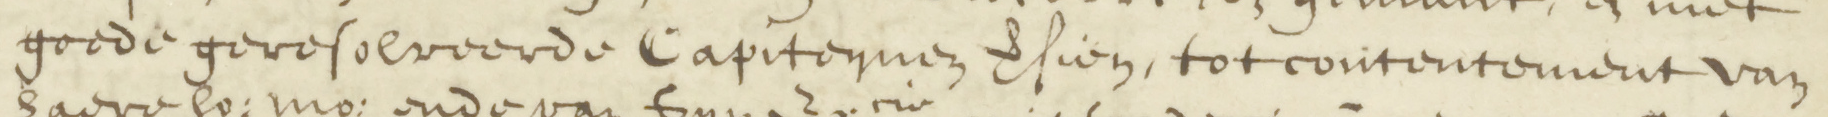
goede geresolveerde Capiteynen vsien, tot contentement van
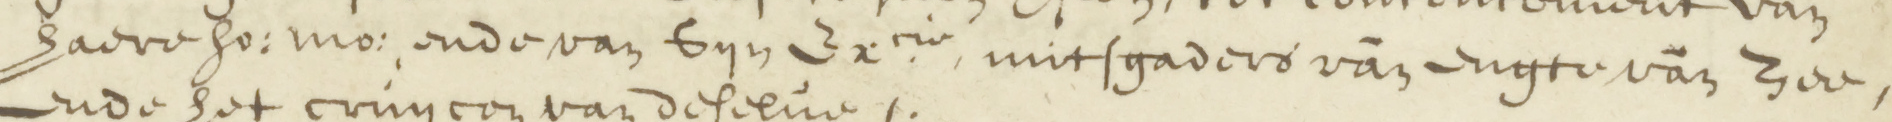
haere Ho:Mo: ende van sijn Excie, mitsgaders van engte van zee,
